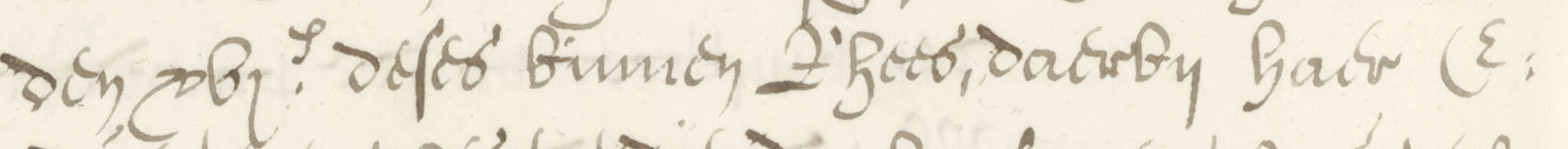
den xvie deses binnen Rhees, daerbij haer E.
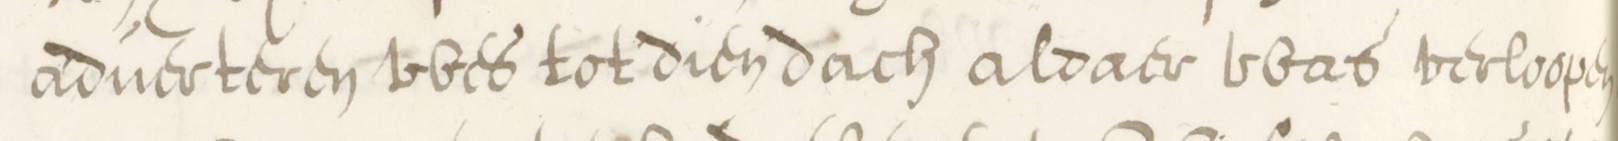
aduerteren wes tot dien dach aldaer was verloopen
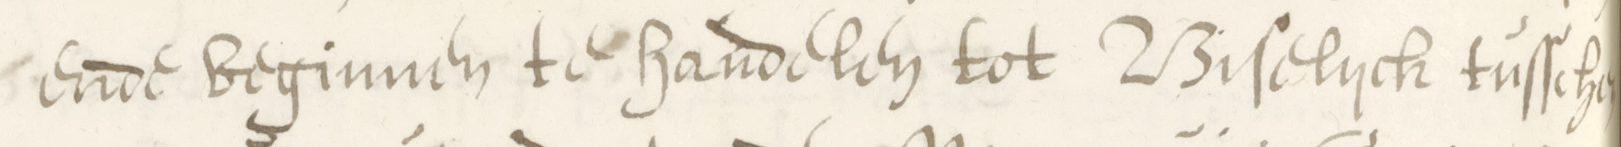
ende beginnen te handelen tot Biselyck tusschen
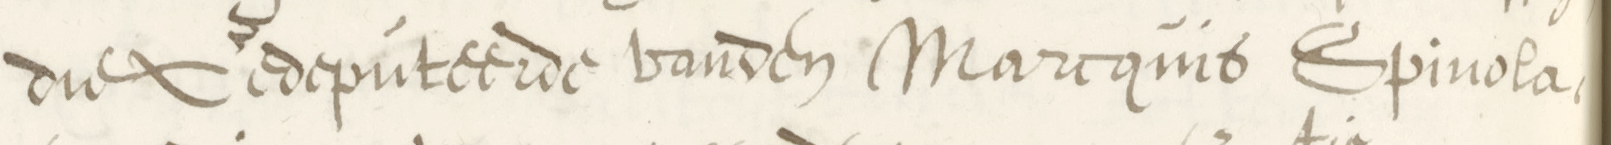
die Gedeputeerde vanden Marcquis Spinola,
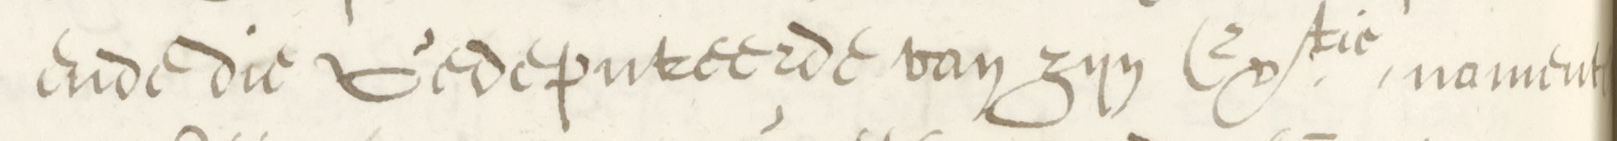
ende die Gedeputeerde van zijn Extie namens
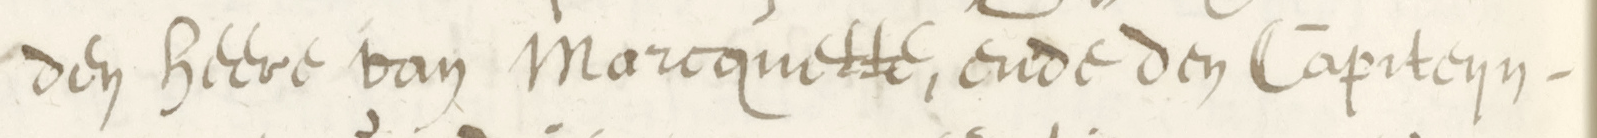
den heere van Marcquette ende den Capiteyn -
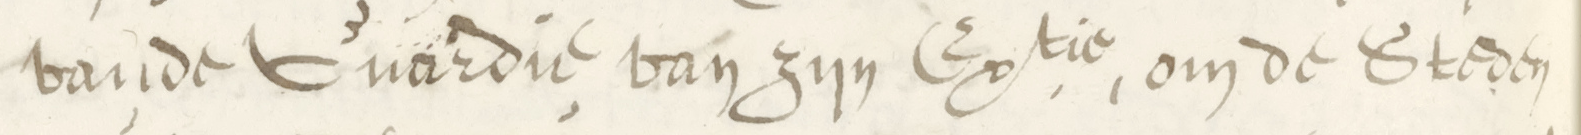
vande Guardie van zyn Extie om de Steden
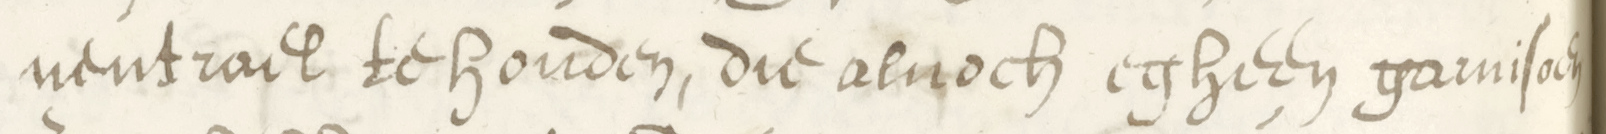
neutraal te houden, die alnoch egheen garnisoen
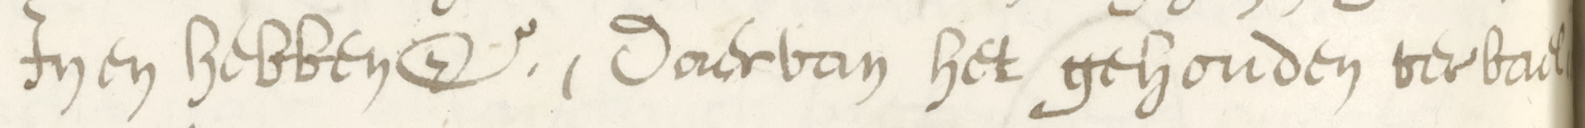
In en hebben E. Daervan het gehouden verbael
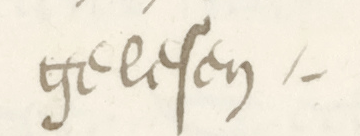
gelesen.
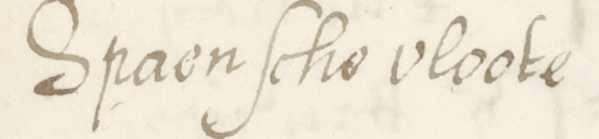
Spaensche vloote
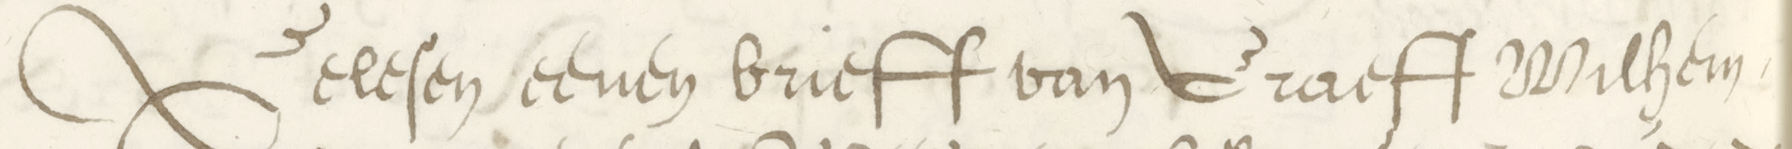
Gelesen eenen brieff van Graeff Wilhem
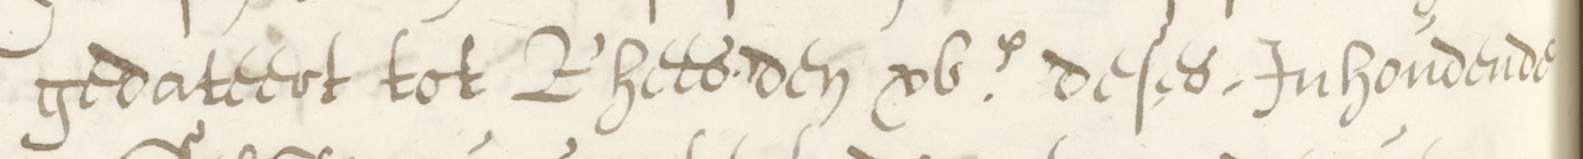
gedateert tot Rhees xve deses, Inhoudende
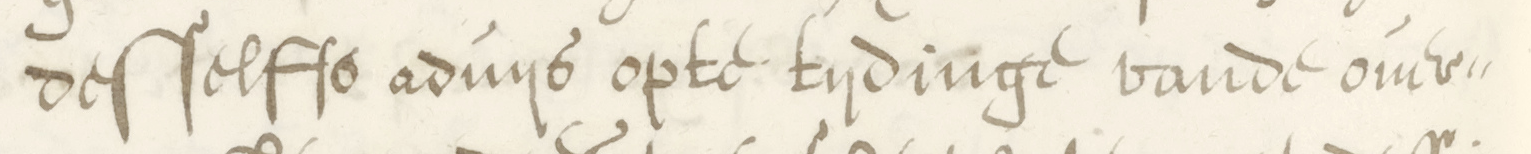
desselfs aduys opte tydinge vande ouer„
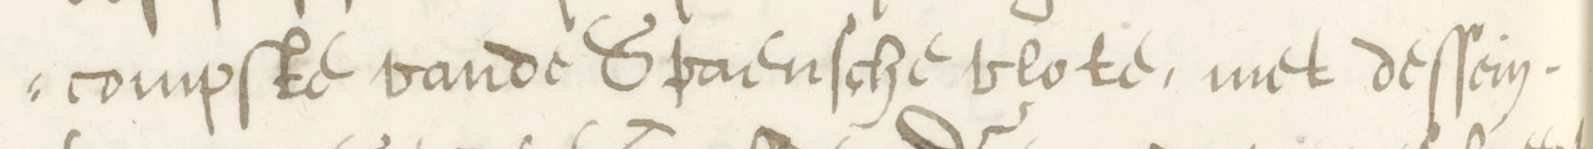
compste vande Spaensche vlote, met dessein
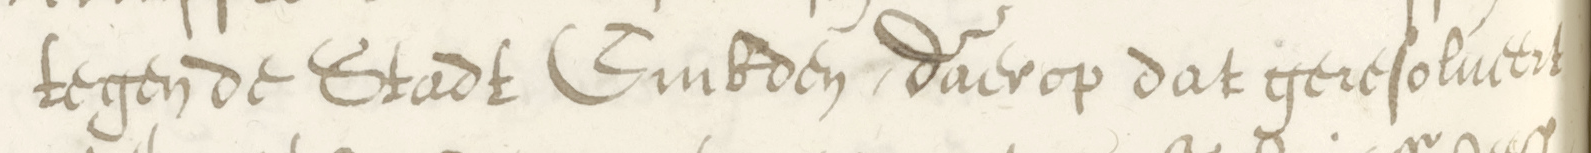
tegen de Stadt Embden, daerop dat geresolueert
